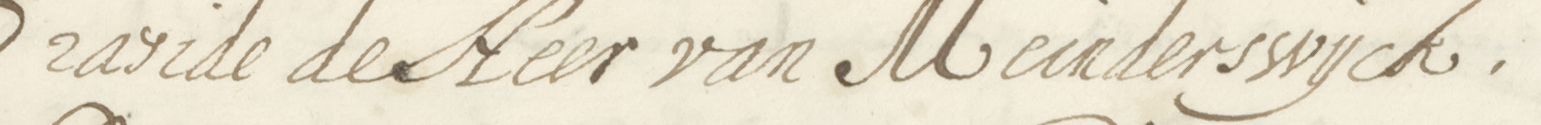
Præside de Heer van Meinderswijck,
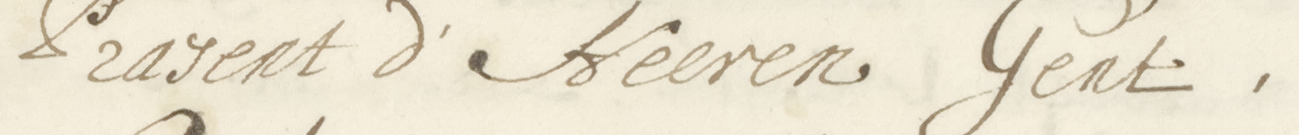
Præsent d' Heeren Gent,
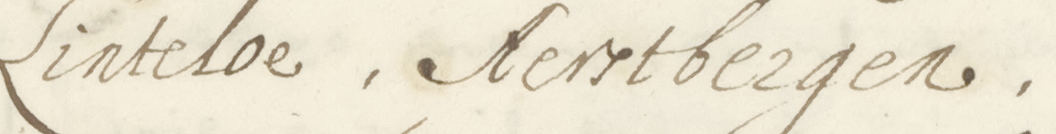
Linteloe, Aerstbergen,
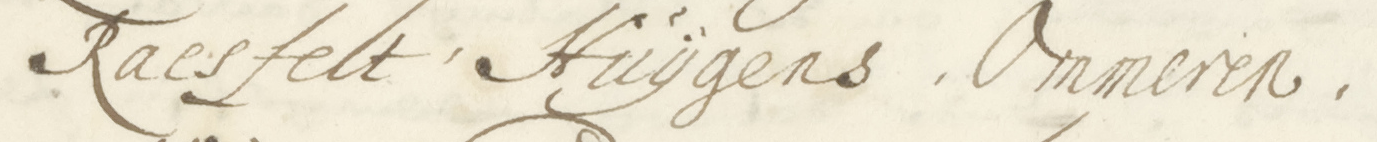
Raesfelt, Huijgens, Ommeren,
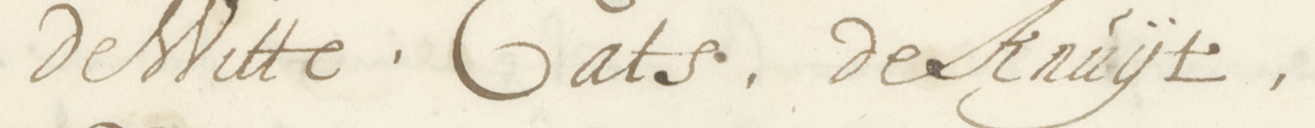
de Witte, Cats, de Knuijt,
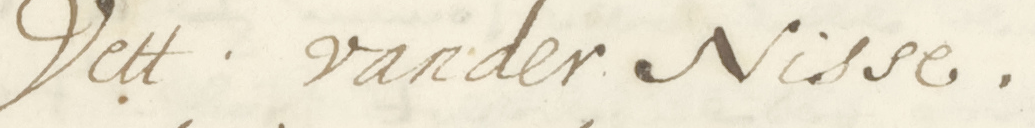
Vett, vander Nisse,
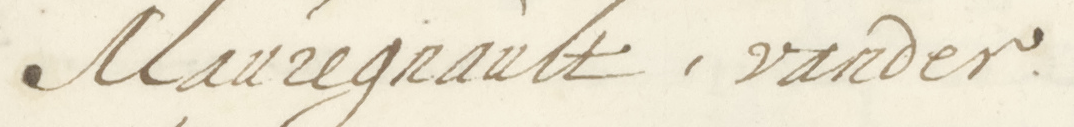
Mauregnault, vander
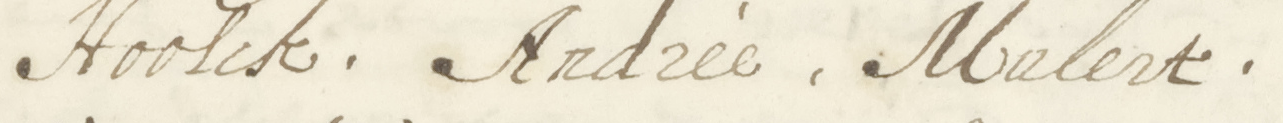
Hoolck, Andreé, Mulert.
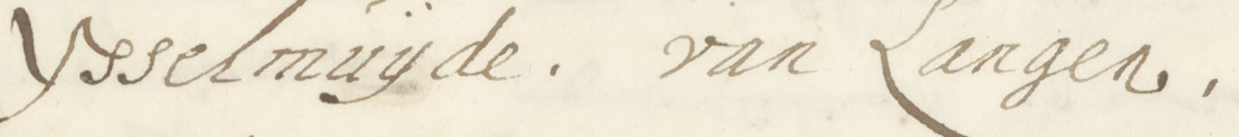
IJsselmuijde, van Langen,
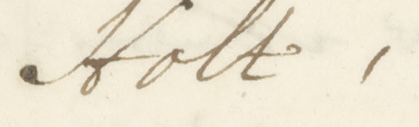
Holt.
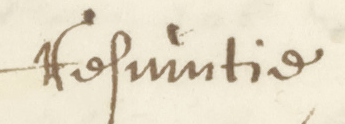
Resumtie
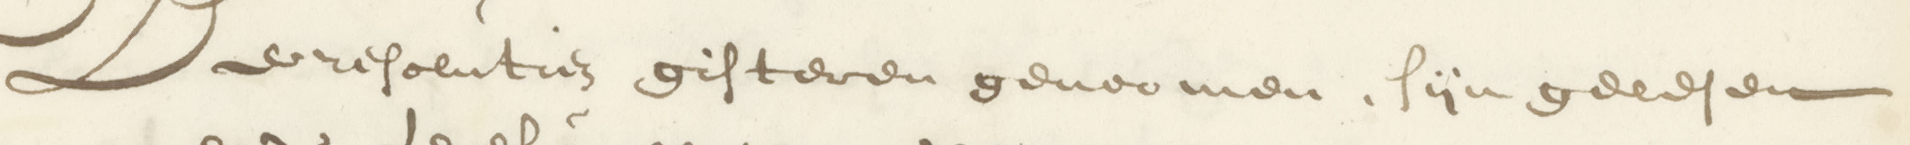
De resolutien gisteren genoomen, sijn gelesen
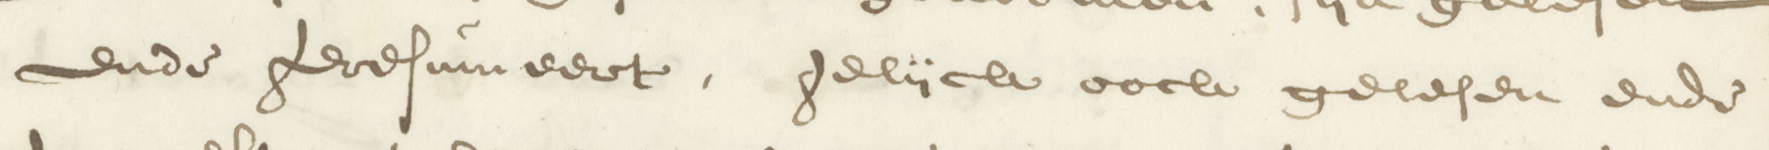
ende geresumeert, gelijck oock gelesen ende
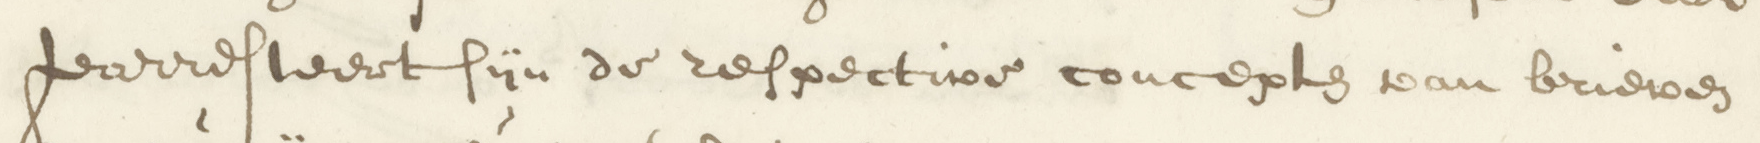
gearresteert sijn de respective concepten van brieven
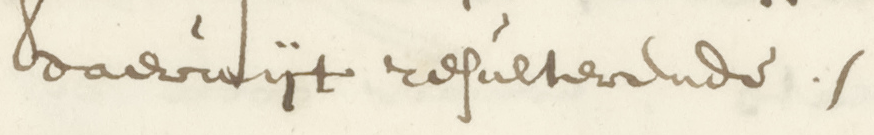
daeruijt resulterende.
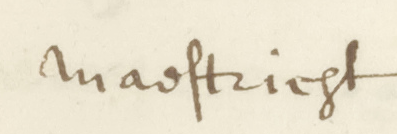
maestricht
